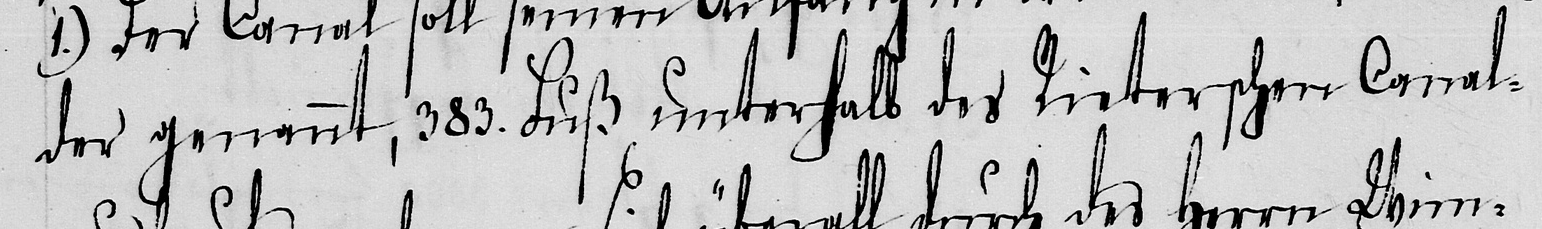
der genannt, 283. Fuß unterhalb des Rieterschen Canal¬
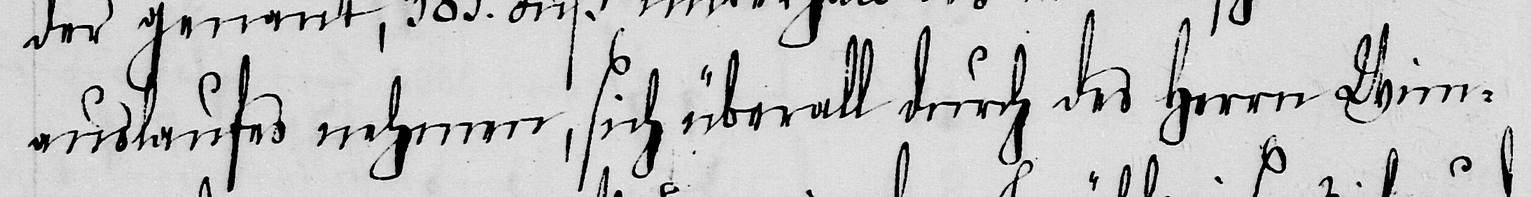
auslaufes nehmen, sich überall durch des Herrn Wim¬
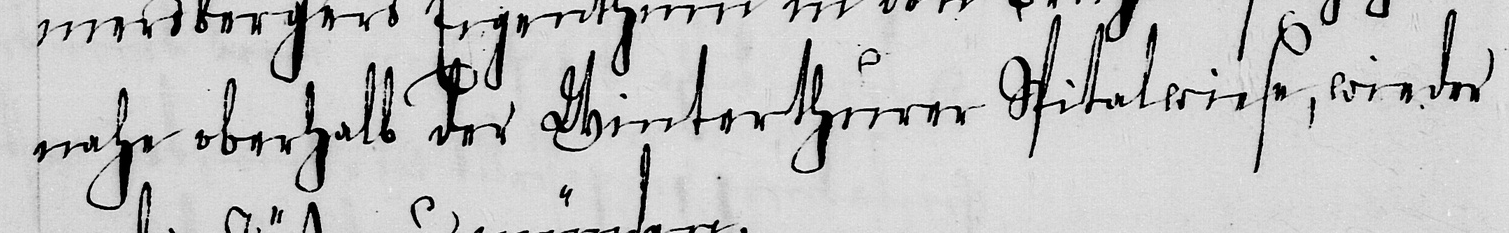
nahe oberhalb der Winterthurer Spitalwiese, wieder
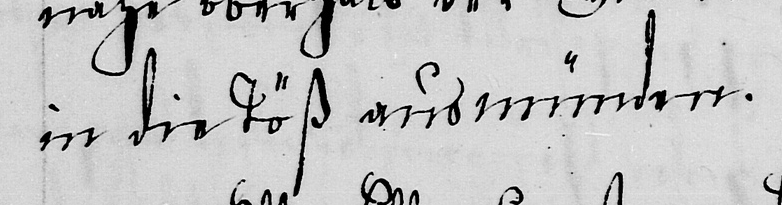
in die Töß ausmünden.
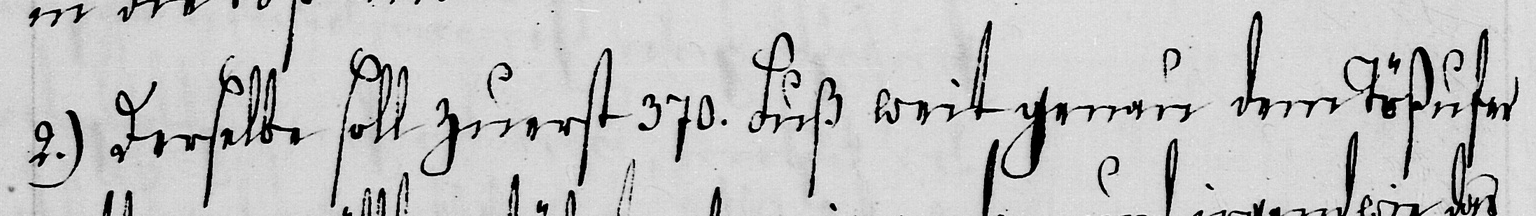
2.) Derselbe soll zuerst 370. Fuß weit genau dem Tößufer
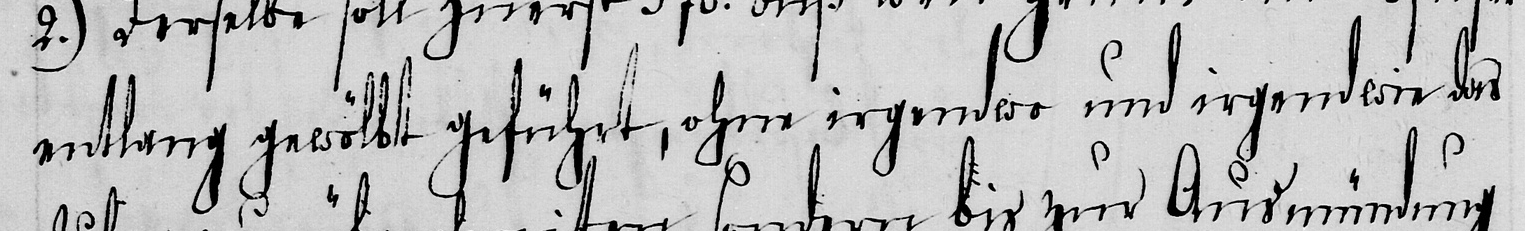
entlang gewölbt geführt, ohne irgendwo und irgendwie das
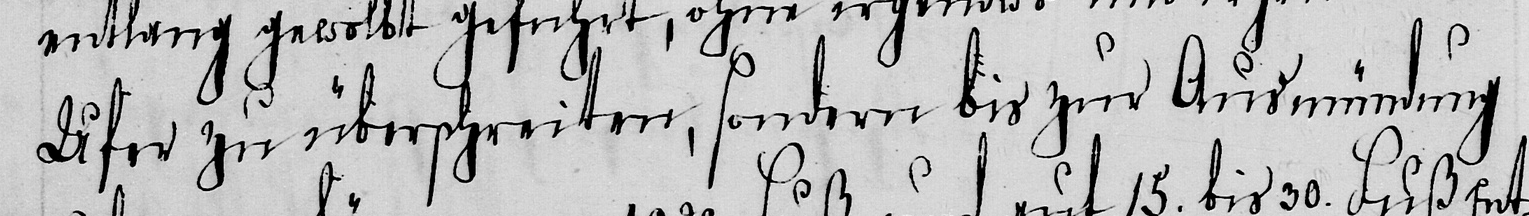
Ufer zu überschreiten, sondern bis zur Ausmündung
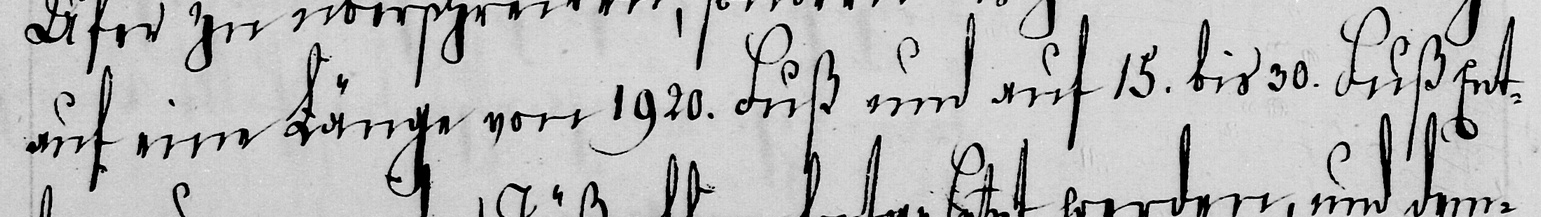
auf eine Länge von 190. Fuß und auf 15. bis 30. Fuß Ent¬
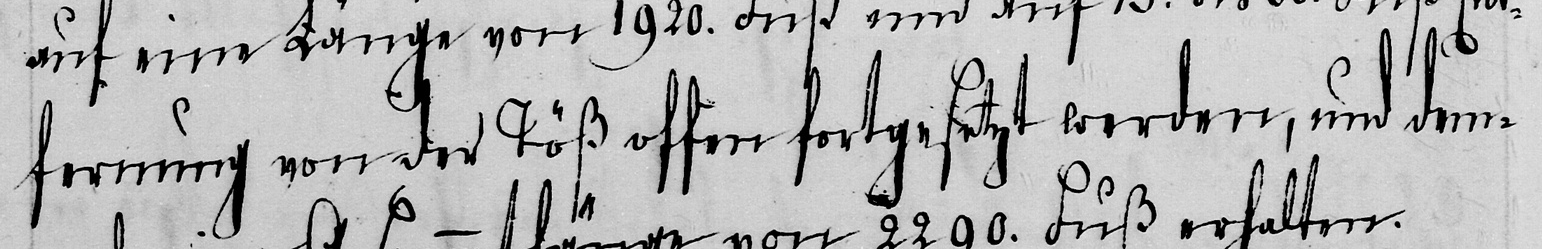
fernung von der Töß offen fortgesetzt werden, und dem¬
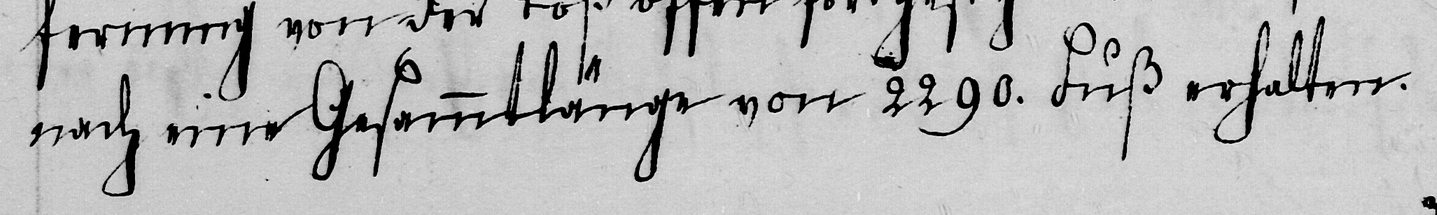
nach eine Gesammtlänge von 2290. Fuß erhalten.
